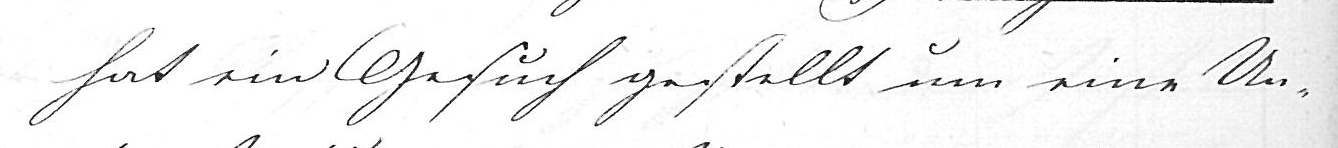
hat ein Gesuch gestellt um eine Un-
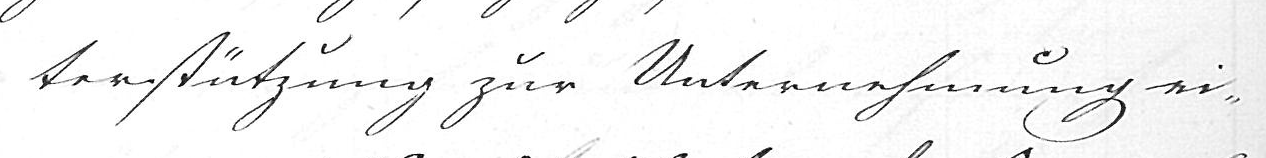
terstützung zur Unternehmung ei-
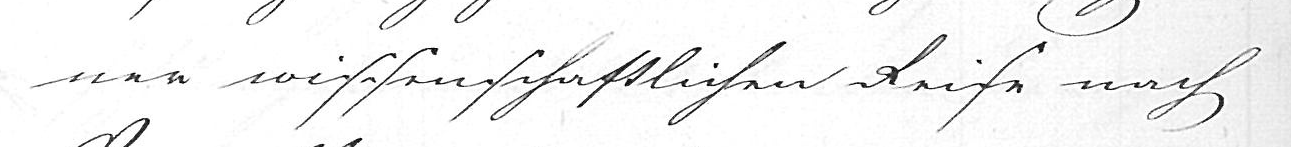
ner wissenschaftlichen Reise nach
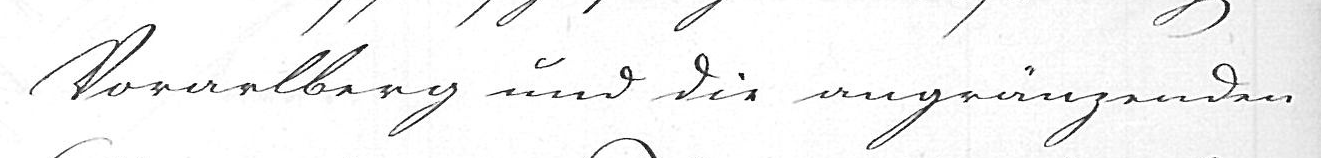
Vorarlberg und die angränzenden
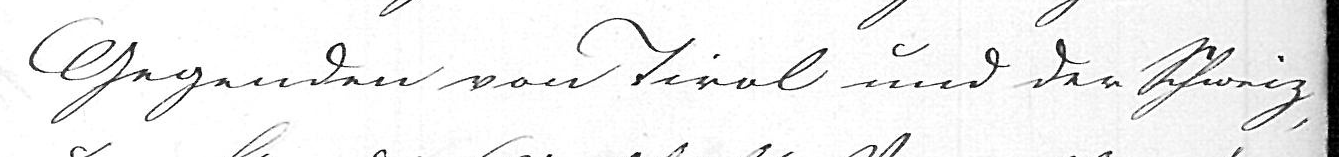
Gegenden von Tirol und der Schweiz,
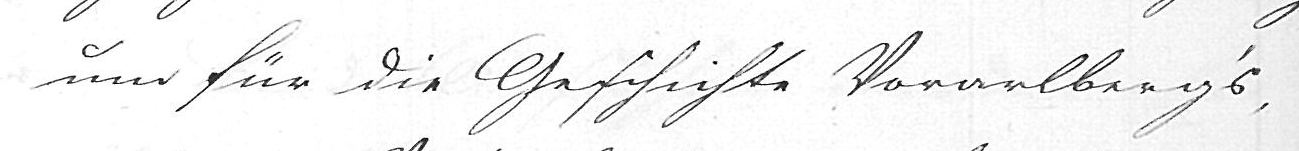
um für die Geschichte Verarlberg's,
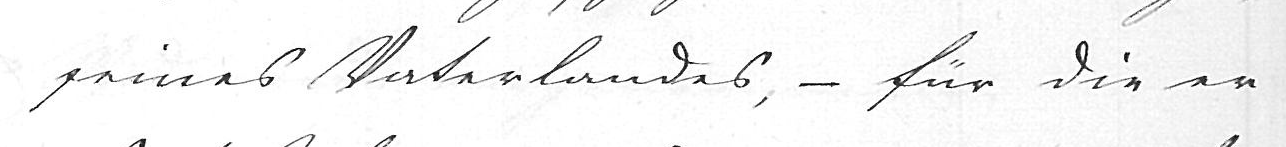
seines Vaterlandes, für die er
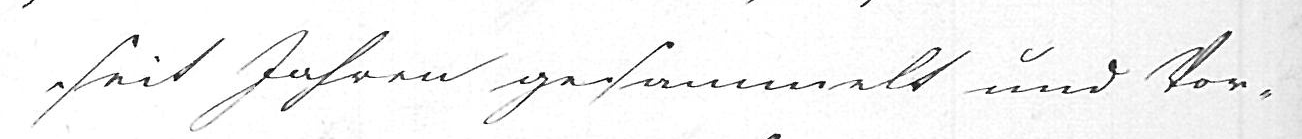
seit Jahren gesammelt und Vor-
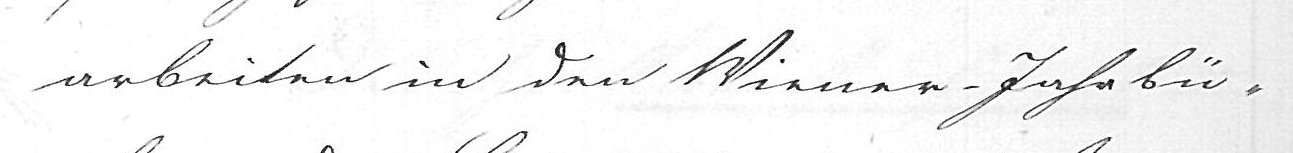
arbeiten in den Wiener Jahrbü-
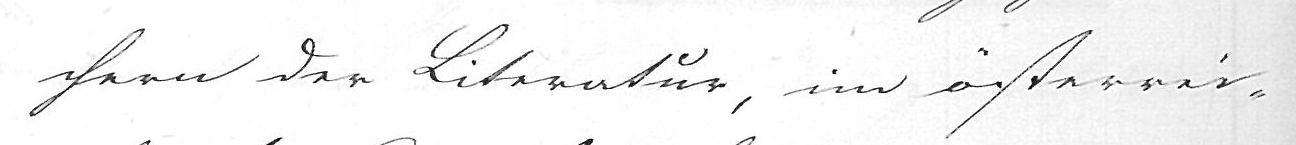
chern der Literatur, im österrei-
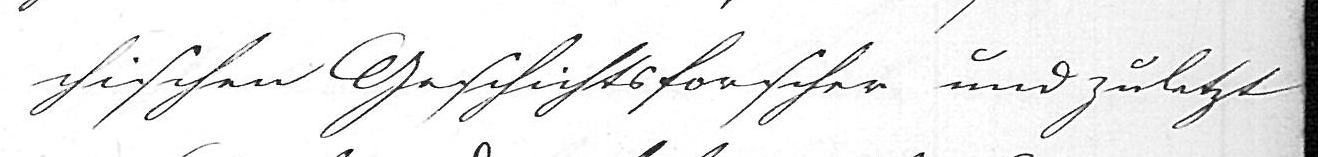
chischen Geschichtsforscher und zuletzt
